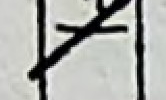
7
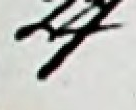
27
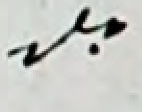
Do
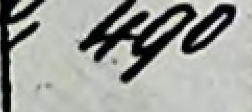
0,490
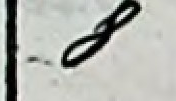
8
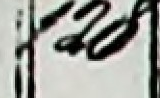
128
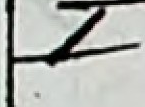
I
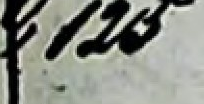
0,125
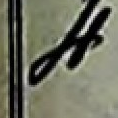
4
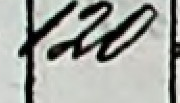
120
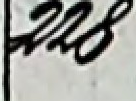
228
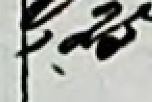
0,25
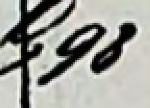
0,98
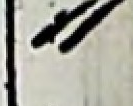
11
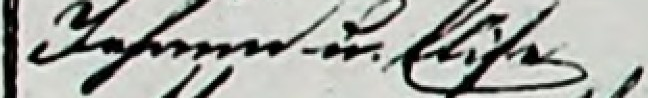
Johann u. Elise
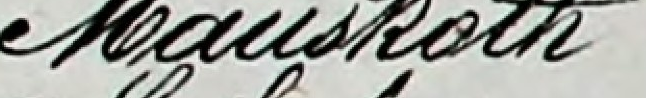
Mauskoth
